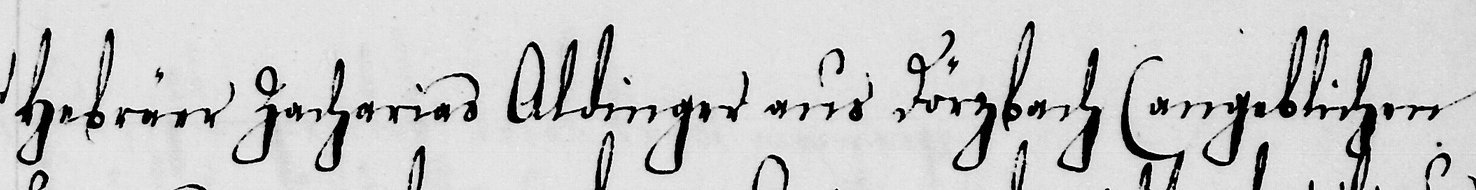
Hebräer Zacharias Aldinger aus Dörzbach (angeblichen
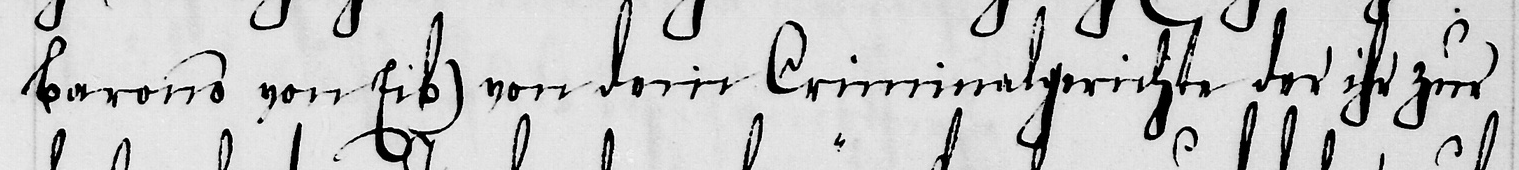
Barons von Eib) von dem Criminalgerichte der ihr zur
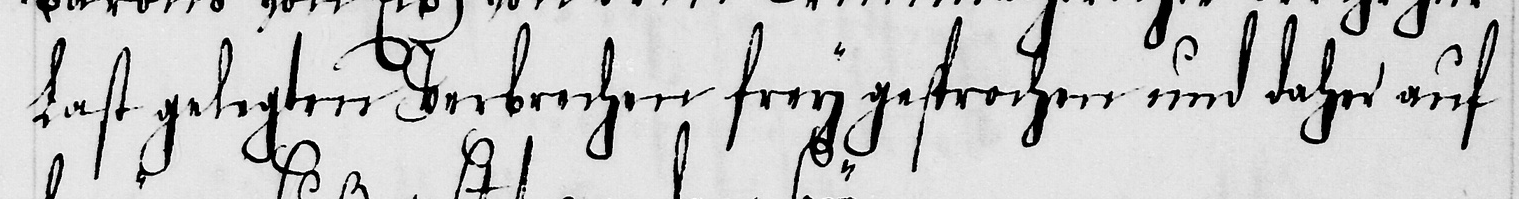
Last gelegten Verbrechen frey gesprochen und daher auf
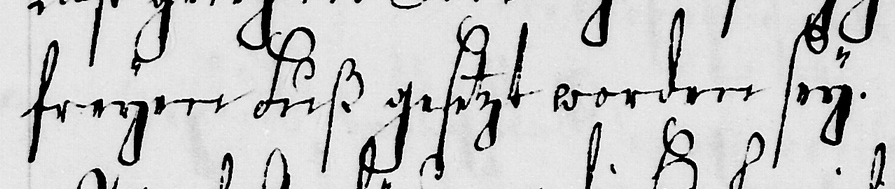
freyen Fuß gesetzt worden sey.
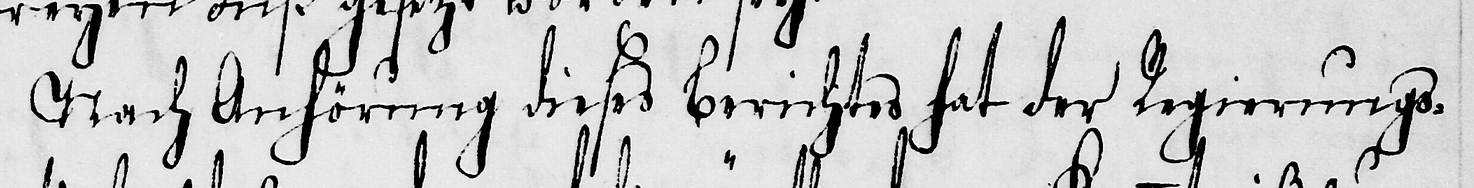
Nach Anhörung dieses Berichts hat der Regierungs¬
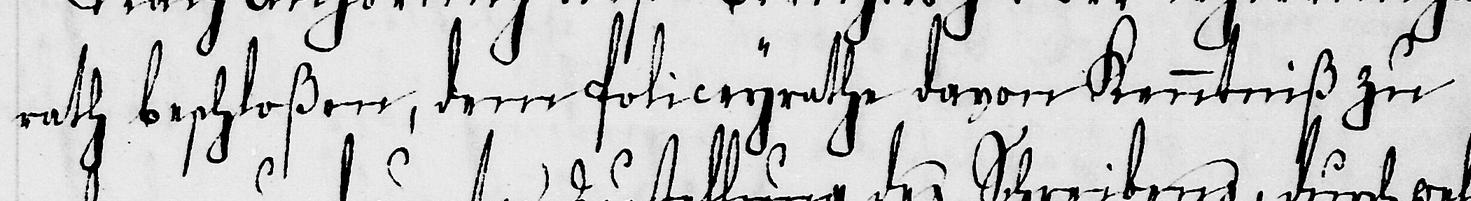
rath beschloßen, dem Policeyrathe davon Kenntniß zu
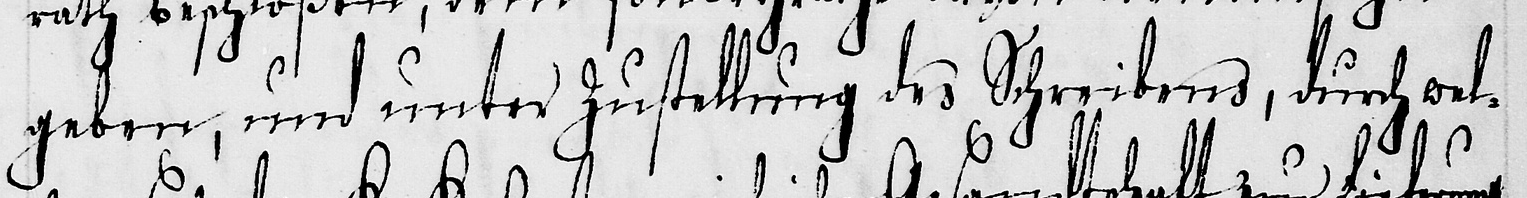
geben, und unter Zustellung des Schreibens, durch wel¬
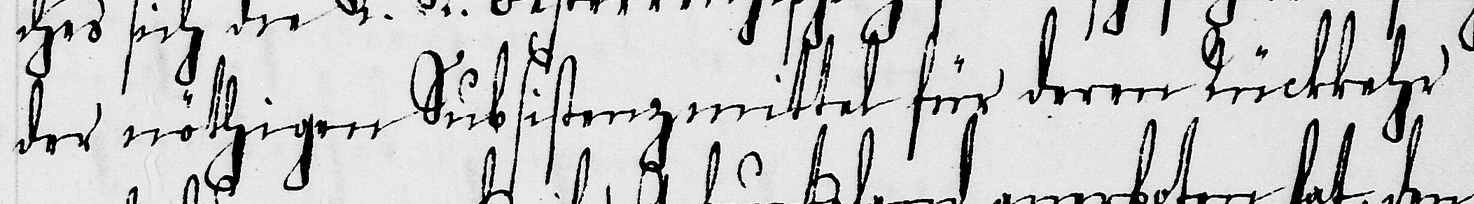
der nöthigen Subsistenzmittel für deren Rückkehr
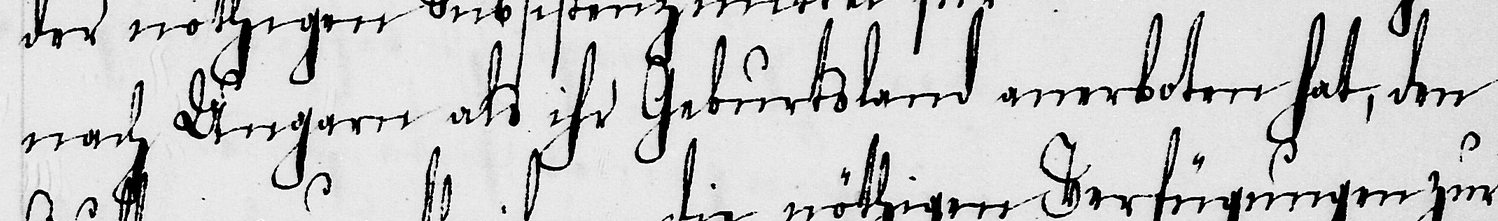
nach Ungarn als ihr Geburtsland anerboten hat, den
